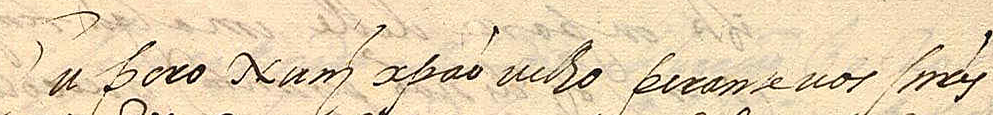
Eu pero Nunz̄ xpaõ uelho perante uos snrēs
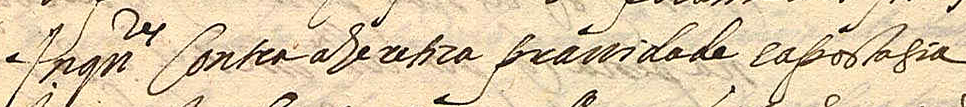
Jnqures Contra a heretica prauidade E apostasia
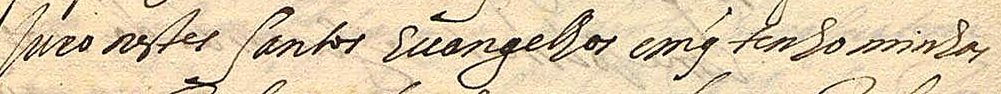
Juro nestes santos Euangelhos em q̄ tenho minhas
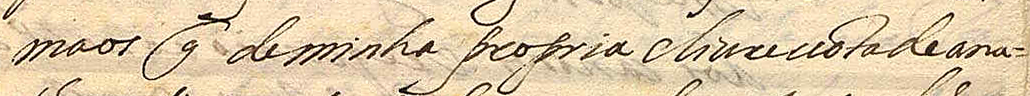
maos q̄ de minha propria e liure uōtade ana
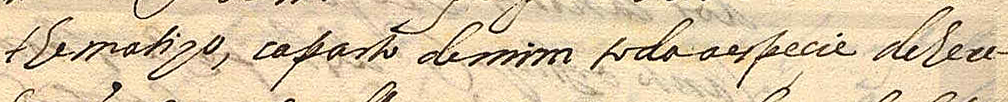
thematizo, e aparto de mim toda a especie de here
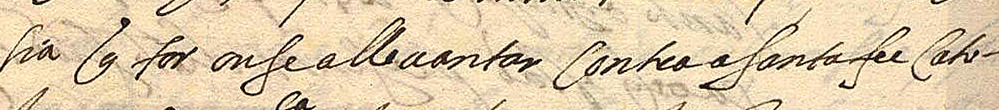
sia q̄ for ou se alleuantar Contra a santa fee Cato
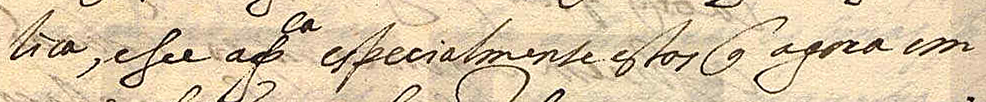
lica, e see apca especialmente estas q̄ agora em
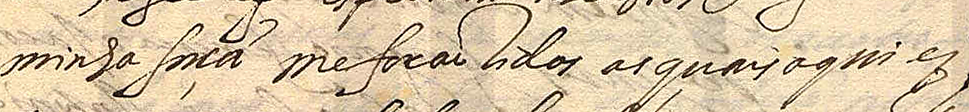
minha snçā me foraõ lidas as quais aqui ej
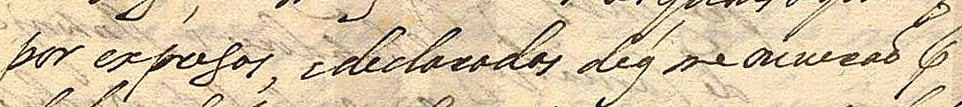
por expresas, E declaradas de q̄ me ouueraõ p̄
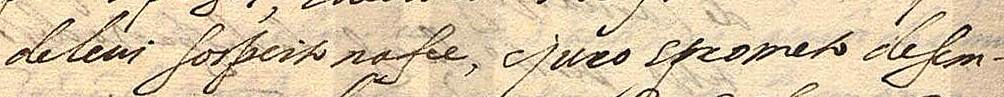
de leui sospeito na fee, e juro E prometo de sem
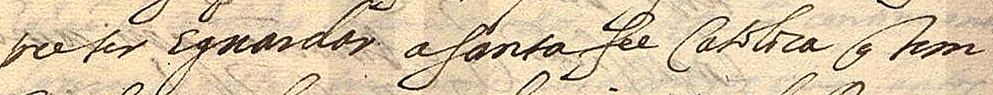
pre ter E guardar a santa fee Catolica q̄ tem
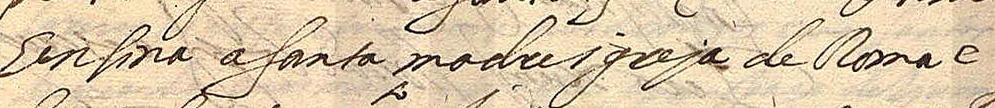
E ensina a santa madre igreja de Roma e
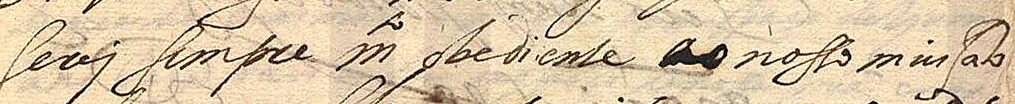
serej sempre mto obediente ao nosso mui sāto
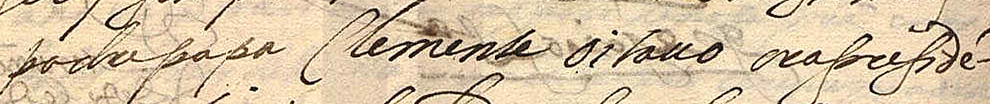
padre papa Clemente oitauo ora presidē
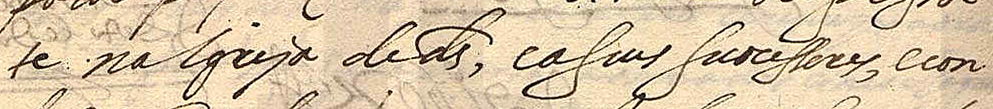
te na Igreja de d̄s, e a seus suocessores, e con
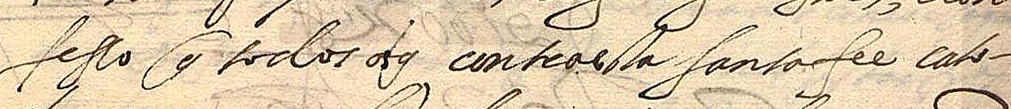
fesso q̅ todos os q̄ contra esta santa fee cato
